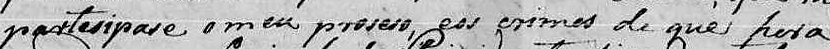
partesipase o meu proseso, e os crimes de que hera
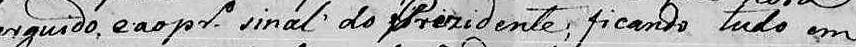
arguido, e ao pr.o sinal do Prizidente, ficando tudo em
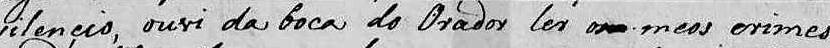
silençio, ouvi da boca do Orador ler os meos crimes
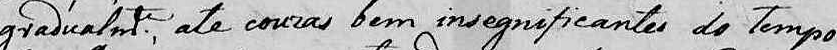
gradualm.te, ate couzas bem insegnificantes do tempo
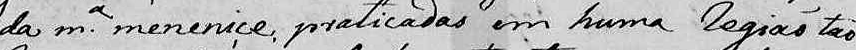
da m.a meneniçe, praticadas em huma Regiaõ taõ
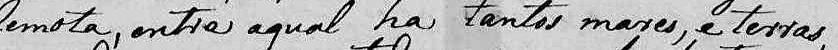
remota, entre a qual ha tantos mares, e terras,
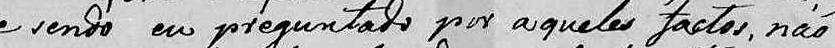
e sendo eu preguntado por aqueles factos, naõ
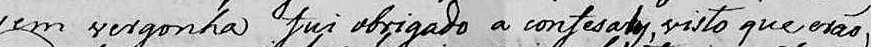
sem vergonha fui obrigado a confesa-los, visto que eraõ,
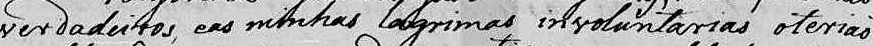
verdadeiros, e as minhas lagrimas involuntarias o teriaõ
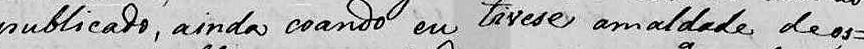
publicado, ainda coando eu tivese a maldade de os
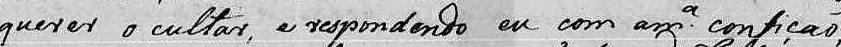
querer ocultar, e respondendo eu com a m.a confiçaõ,
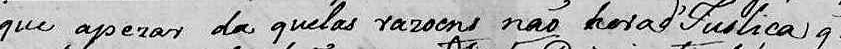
que apezar daquelas razoens naõ hera d'Justiça q̄
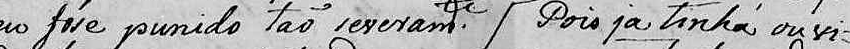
eu fose punido taõ severam.te. [Pois ja tinha ouvi
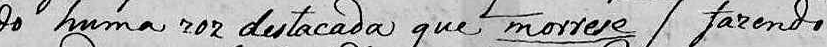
do huma voz destacada que morrese] fazendo
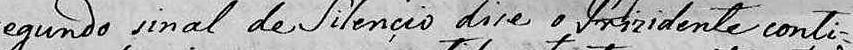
segundo sinal de Silençio dise o Prizidente conti
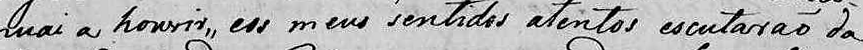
nuai a houvir,, e os meus sentidos atentos escutaraõ da
